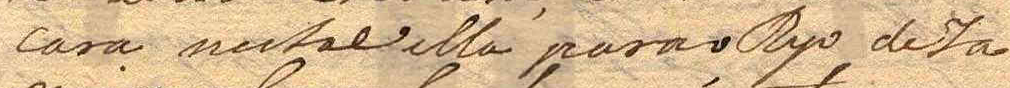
cara nesta villa para o Ryo de Ja
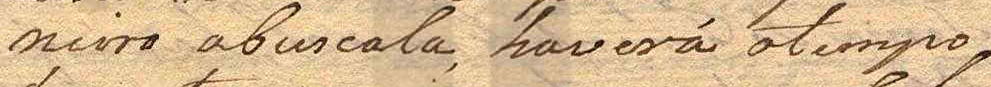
neiro a buscala, haverá o tempo
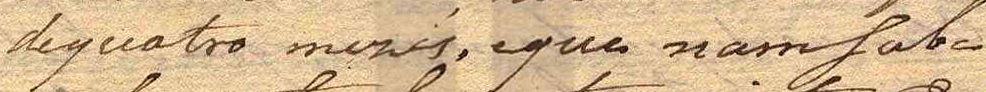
de quatro mezes, e que nam sabe
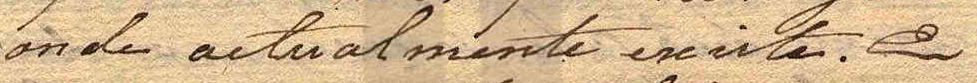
onde actualmente escrita. E
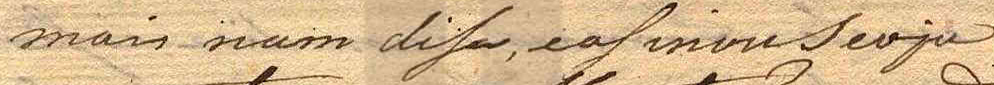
mais nam dise, e asinou seo ju
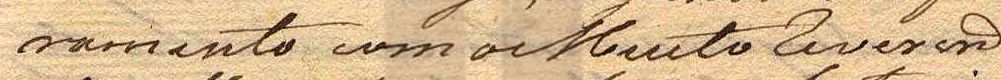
ramento com o Muito Reveren
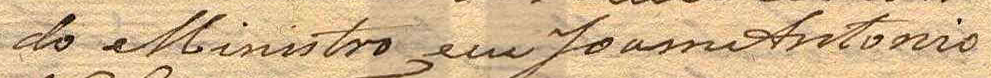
do e Ministro e eu Joam Antonio
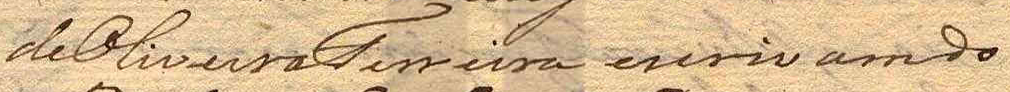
de Oliveira Ferreira escrivam do
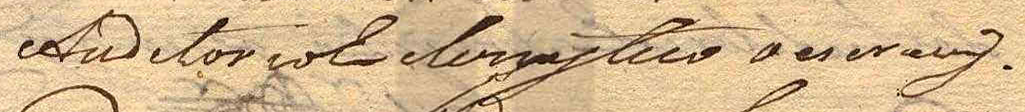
Auditorio Ecleziastico o escrevj.
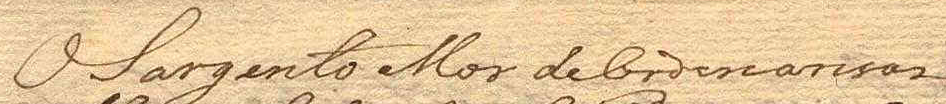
O Sargento Mor de Ordenansas
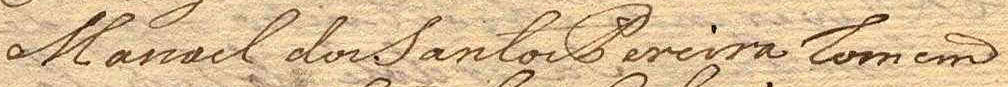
Manoel dos Santos Pereira Homem
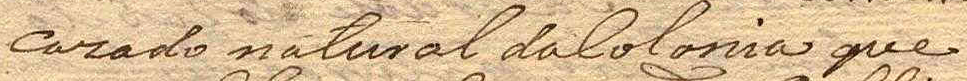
cazado natural da Colonia que
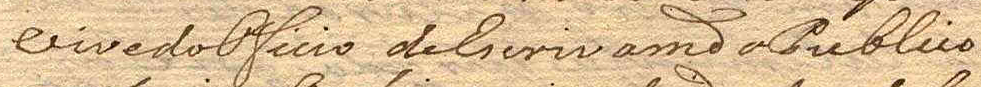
vive do Oficio de Escrivam do Publico
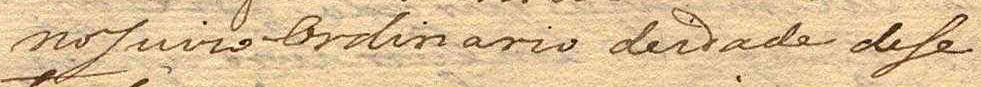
no Juizo ordinario de idade de se
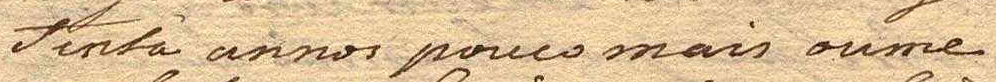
tenta annos pouco mais ou me
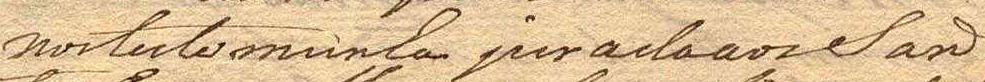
nos testemunha jurada aos San
